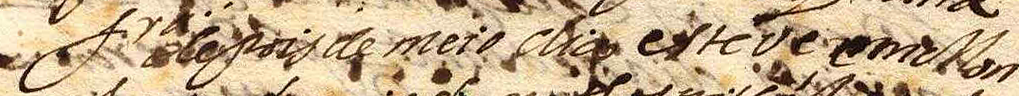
fra depois de meio dia esteve em Mon
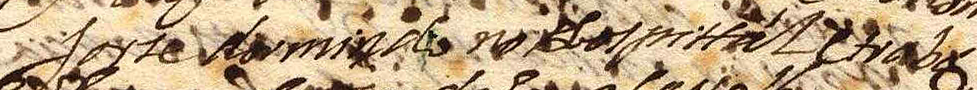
forte dormindo no hospittaL e traba
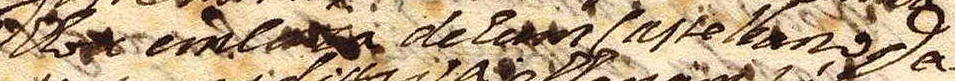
lhou em caza de hum Castelhano q̄ a
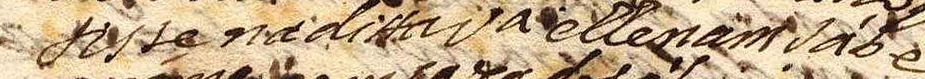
siste na ditta va elle nam sabe
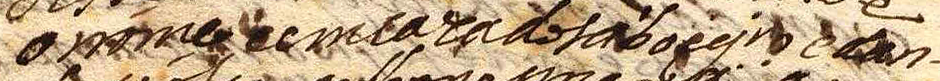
o nome, e em caza do saboeyro e dan
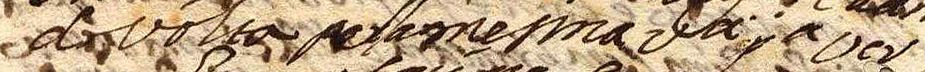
do volta pella mesma v.a pa ver
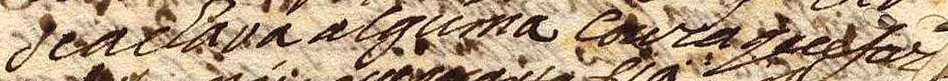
se achava algúmas couzas que faz
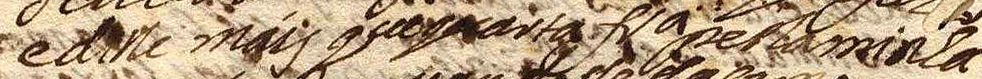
e disse máis que quarta fr.a pella minha
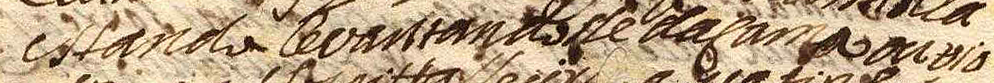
estando levantandosse da Cama ouvio
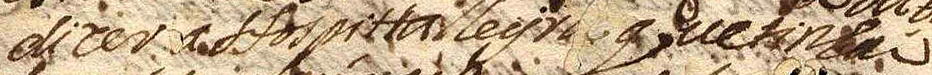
dizer a Hospittalleyro que tinha
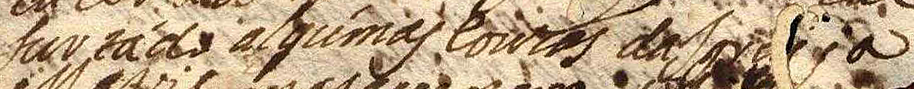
furtado algumas couzas da Jgreija
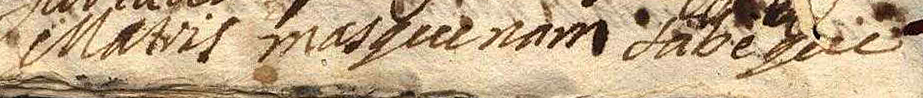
Matris, mas que nam sabe que
